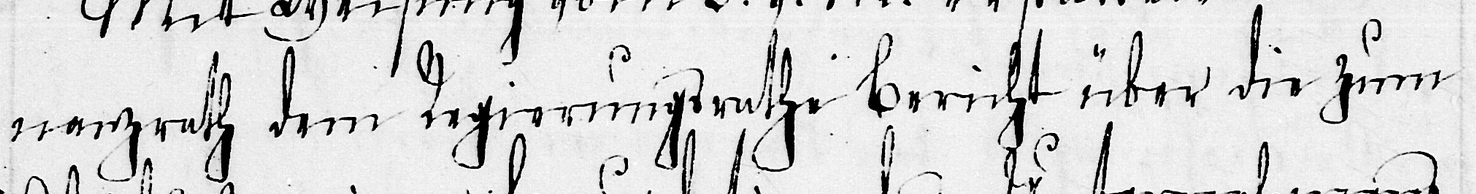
nanzrath dem Regierungsrathe Bericht über die zum
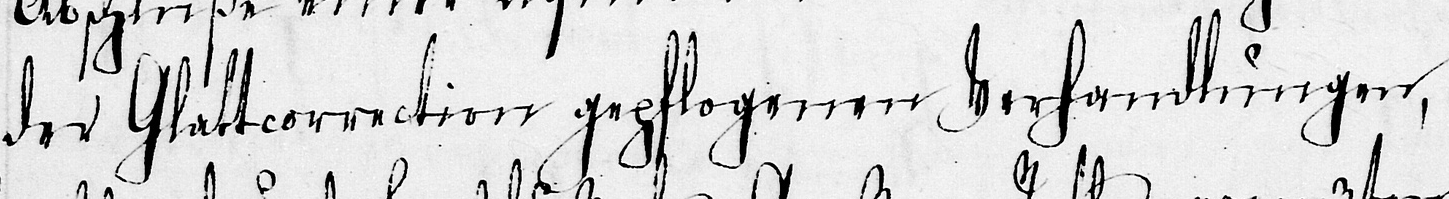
der Glattcorrection gepflogenen Verhandlungen,
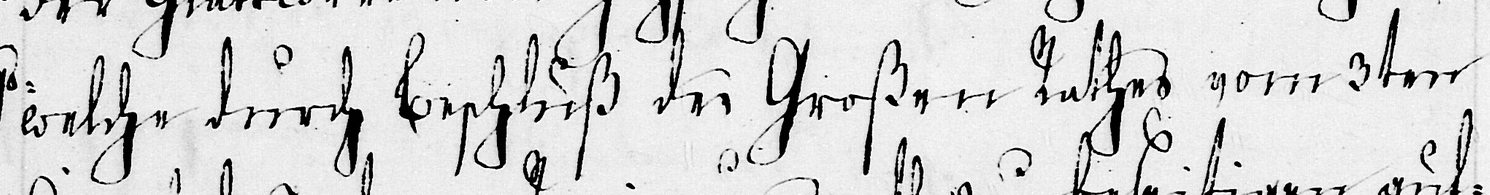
welche durch Beschluß des Großen Rathes vom 3ten
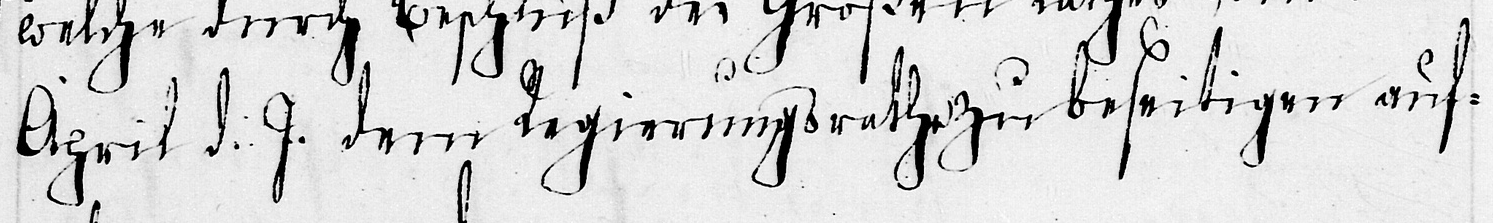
April d. J. dem Regierungsrathe zu beseitigen auf¬
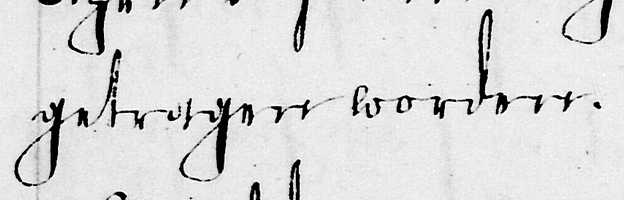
getragen worden.
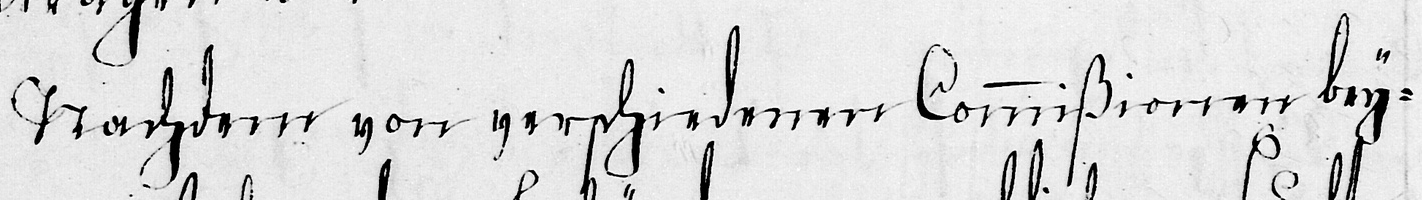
Nachdem von verschiedenen Commißionen bey¬
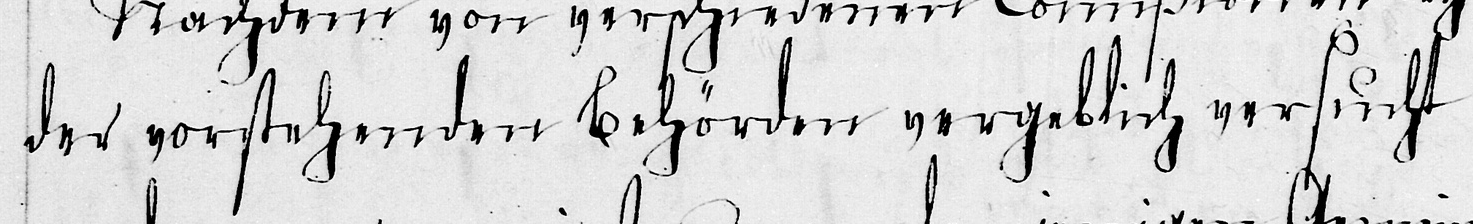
der vorstehenden Behörden vergeblich versucht
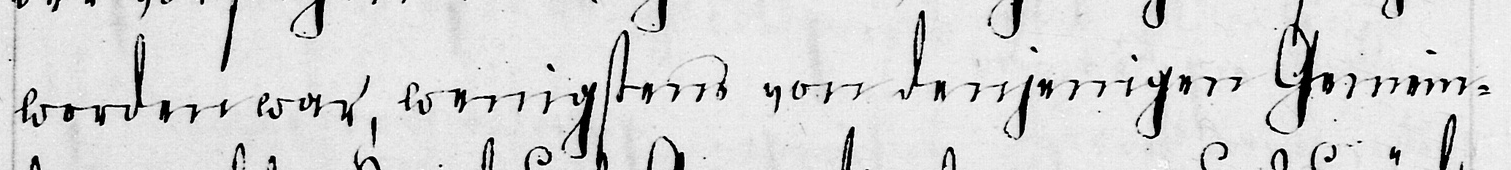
worden war, wenigstens von denjenigen Gemein¬
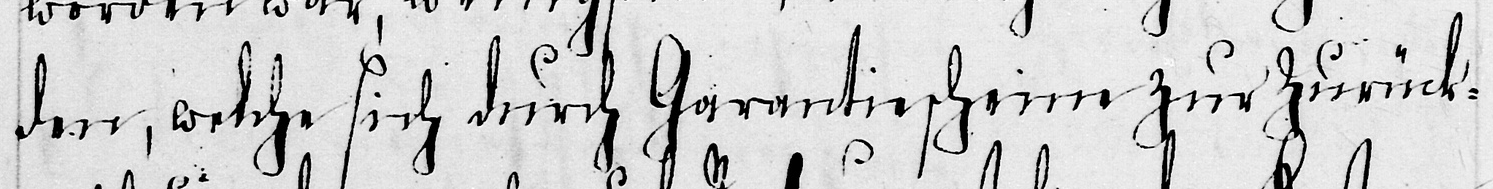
den, welche sich durch Garantiescheine zur Zurück¬
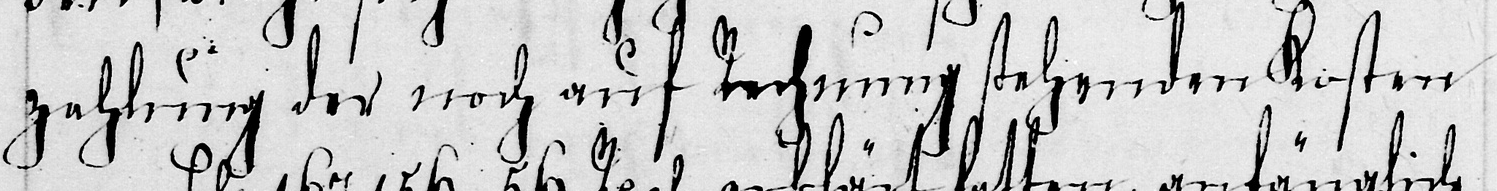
zahlung der noch auf Rechnung stehenden Kosten
